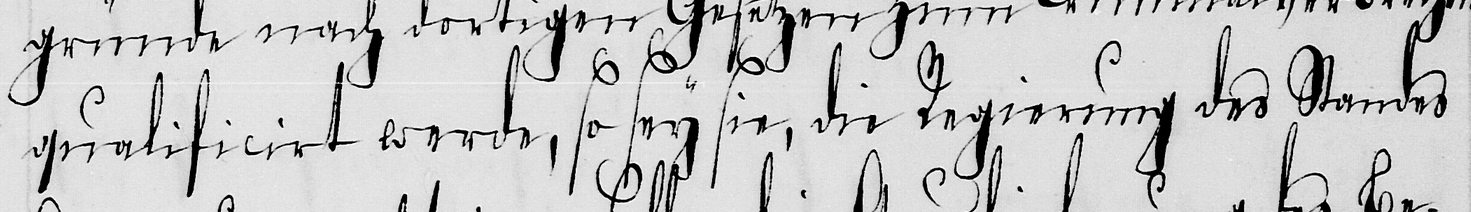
qualificirt werde, so sey sie, die Regierung des Standes
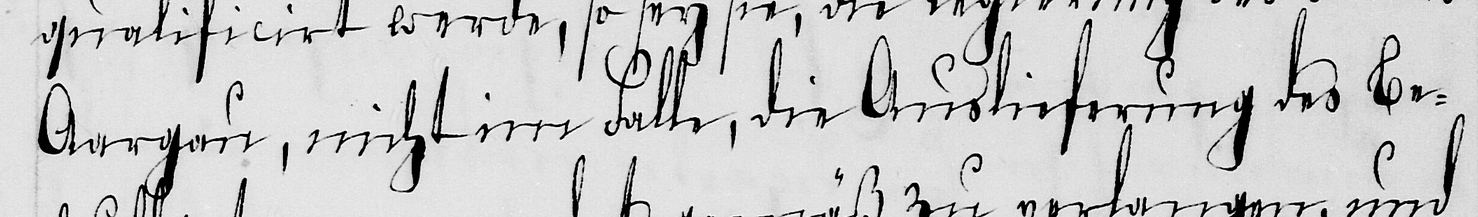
Aargau, nicht im Falle, die Auslieferung des Be¬
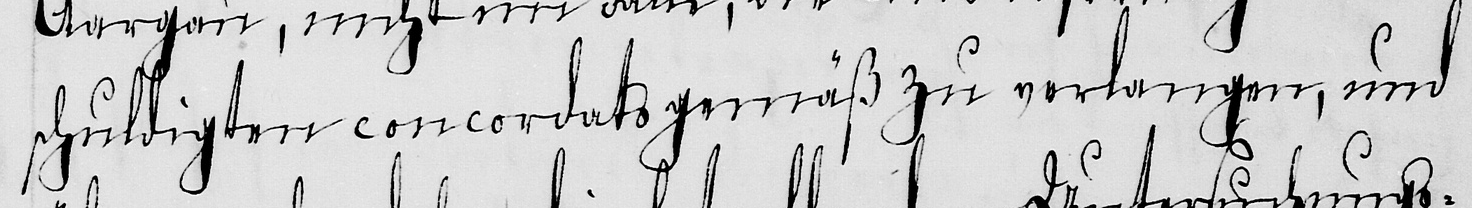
schuldigten concordatsgemäß zu verlangen, und
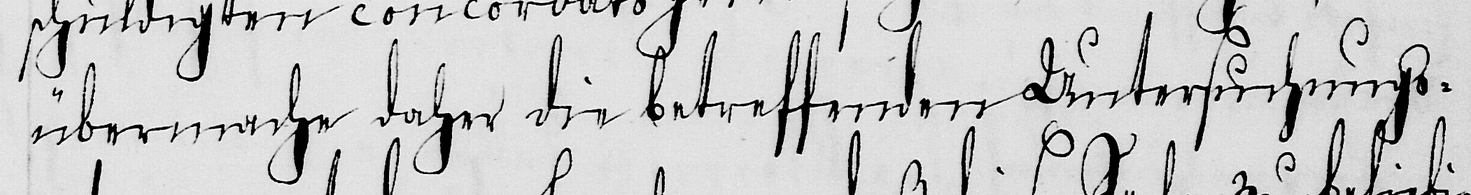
übermache daher die betreffenden Untersuchungs¬
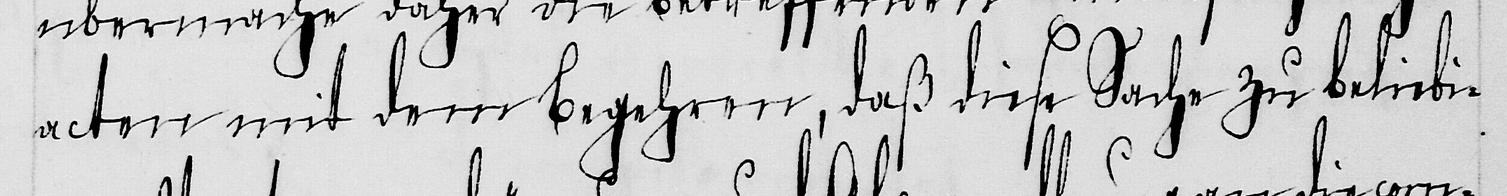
acten mit dem Begehren, daß diese Sache zu beliebi¬
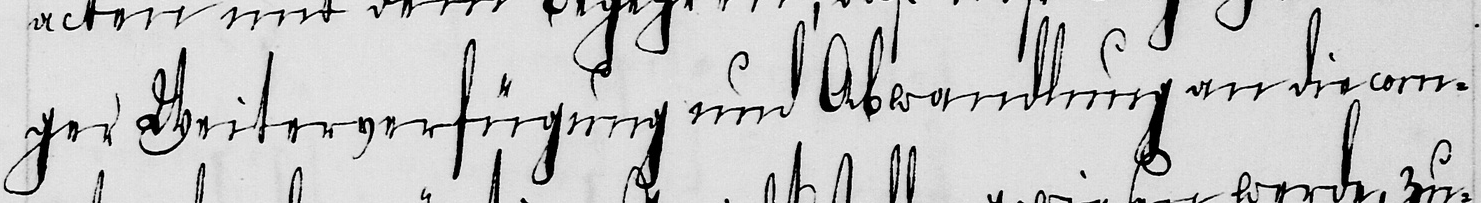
ger Weiterverfügung und Abwandlung an die com¬
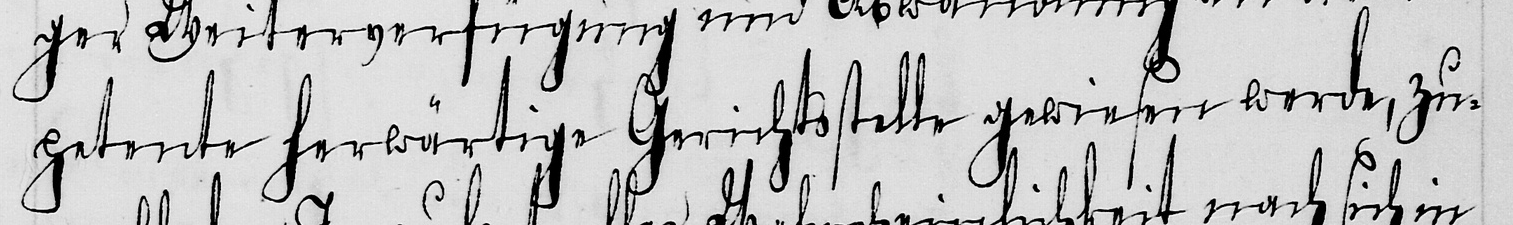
petente herwärtige Gerichtsstelle gewiesen werde, zu¬
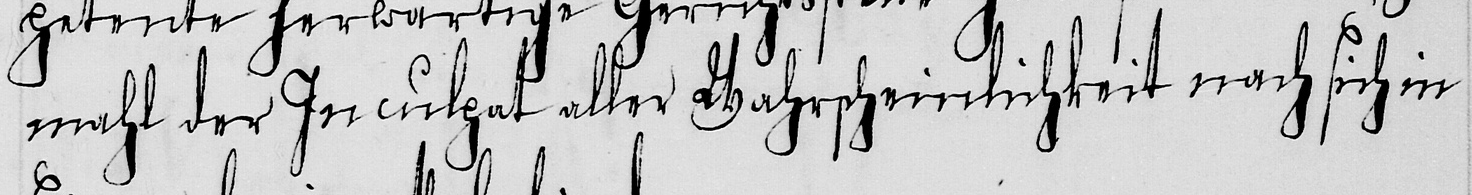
mahl der Inculpat aller Wahrscheinlichkeit nach sich in
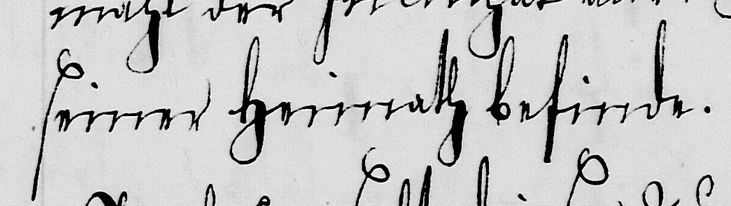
seiner Heimath befinde.
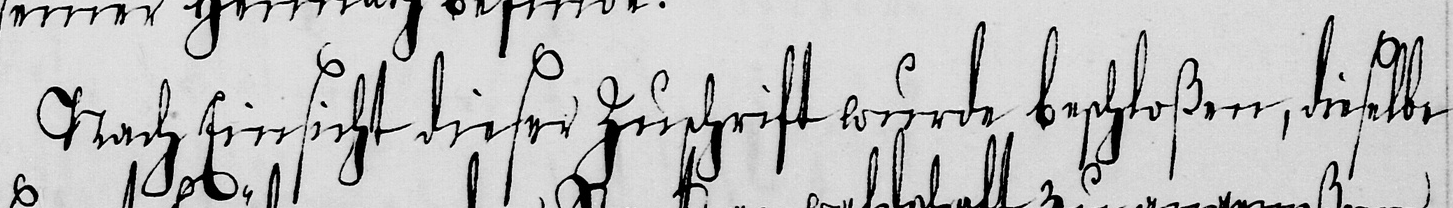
Nach Einsicht dieser Zuschrift wurde beschloßen, diesel¬
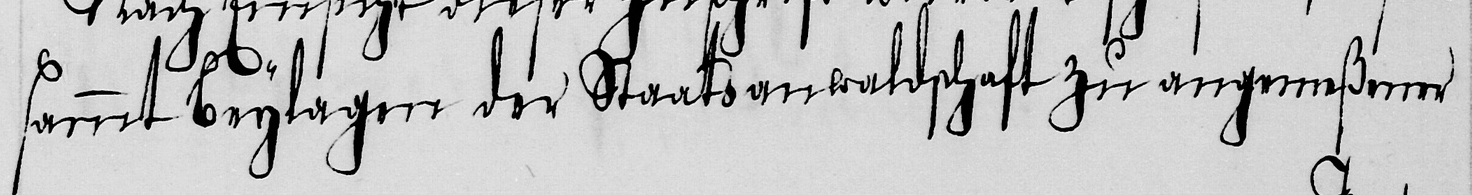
sammt Beylagen der Staatsanwaldschaft zu angemeßener
